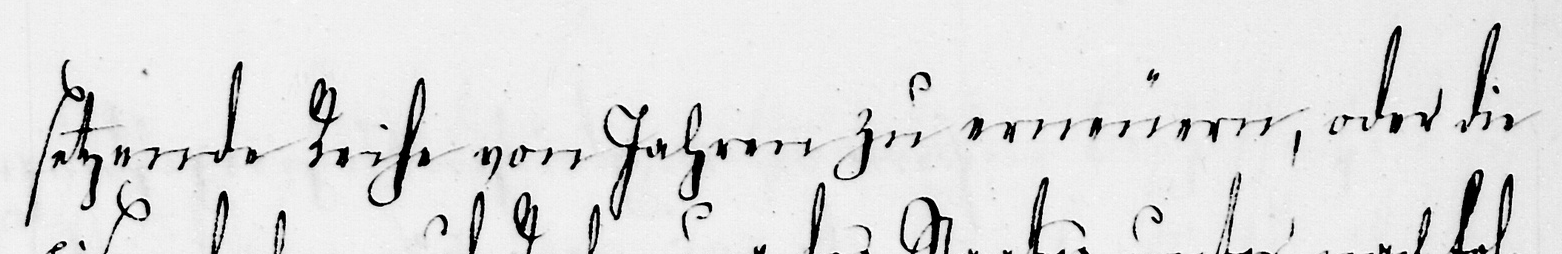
setzende Reihe von Jahren zu erneuern, oder die
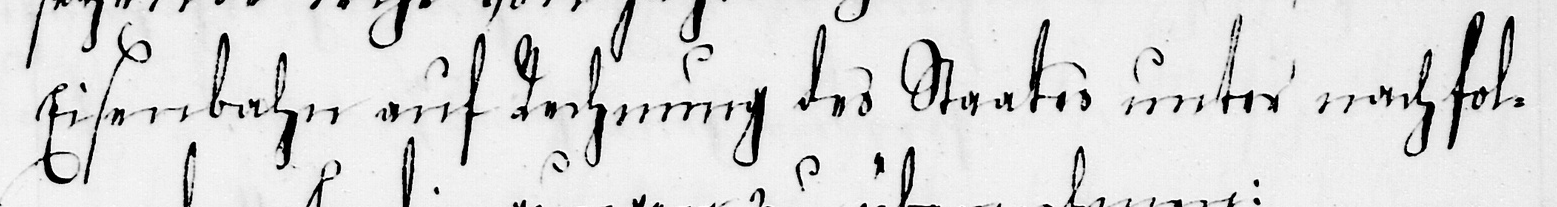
Eisenbahn auf Rechnung des Staates unter nachfol¬
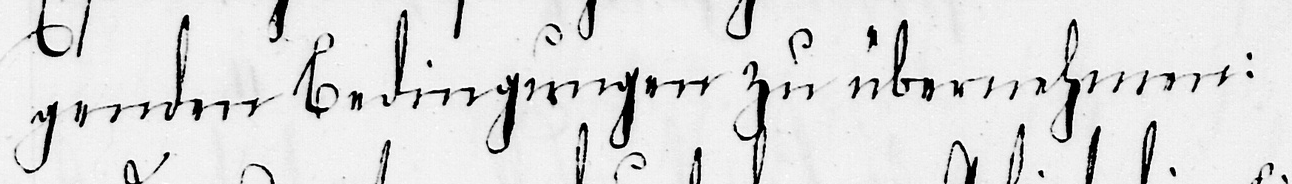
genden Bedingungen zu übernehmen:
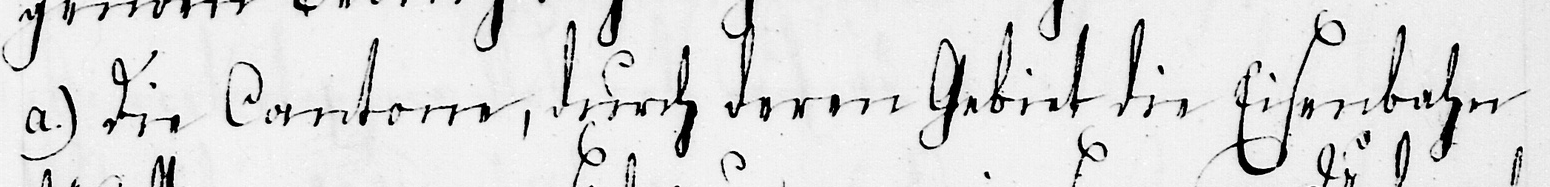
a.) Die Cantone, durch deren Gebiet die Eisenbahn
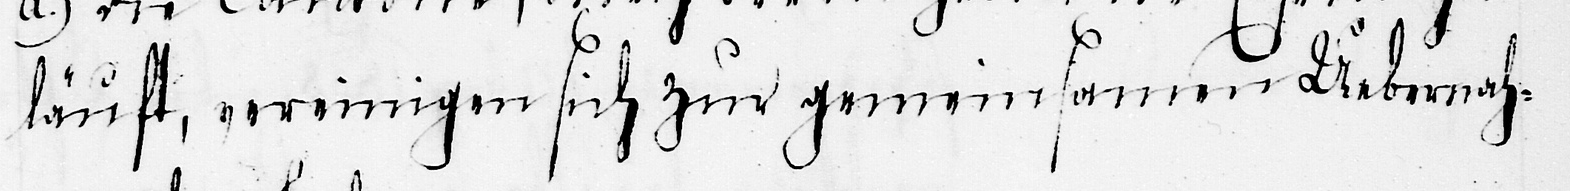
läuft, vereinigen sich zur gemeinsamen Uebernah¬
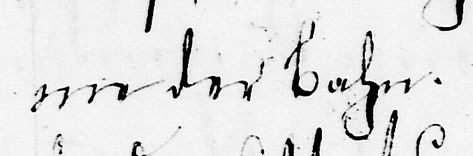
me der Bahn.
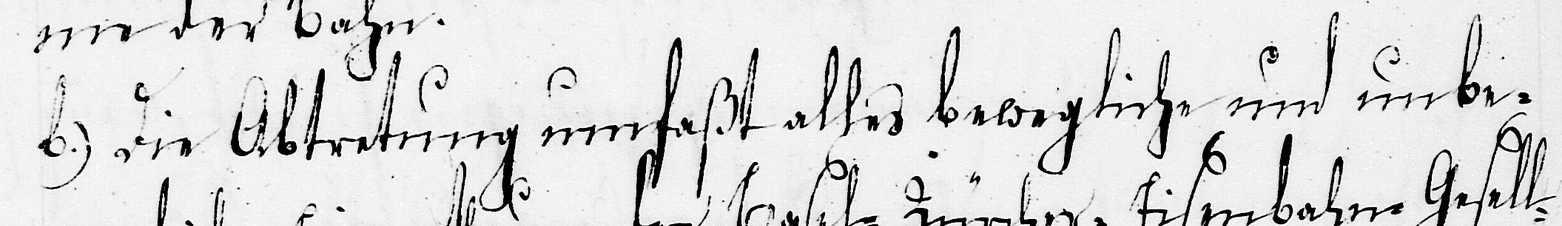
b.) Die Abtretung umfaßt alles bewegliche und unbe¬
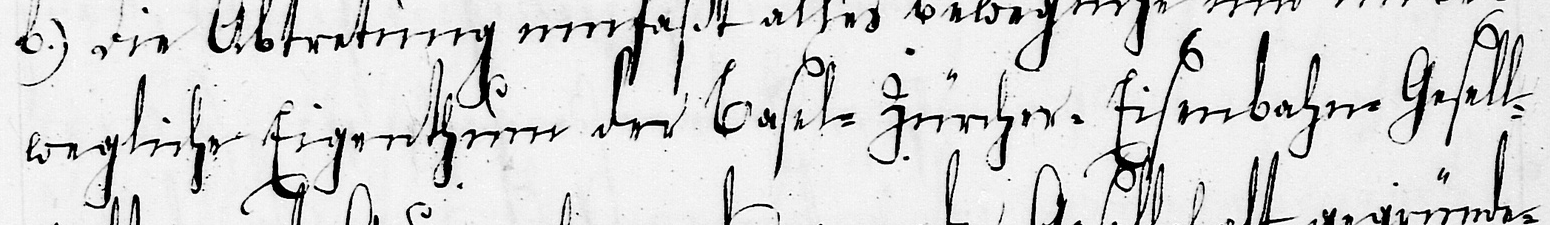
wegliche Eigenthum der Basel-Zürcher-Eisenbahn-Gesell¬
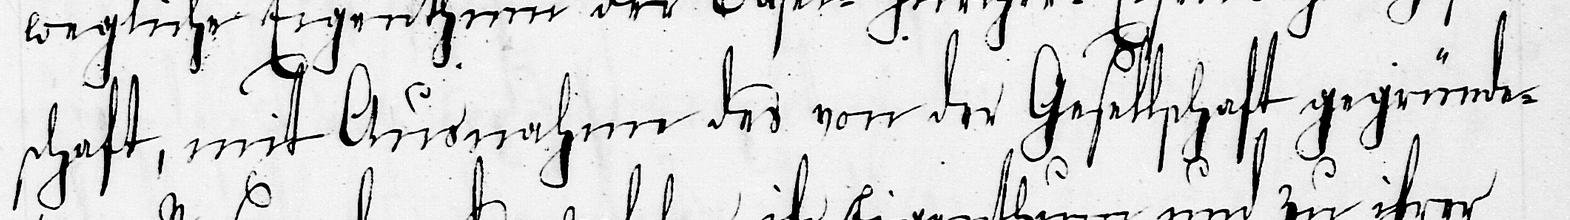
schaft, mit Ausnahme des von der Gesellschaft gegründe¬
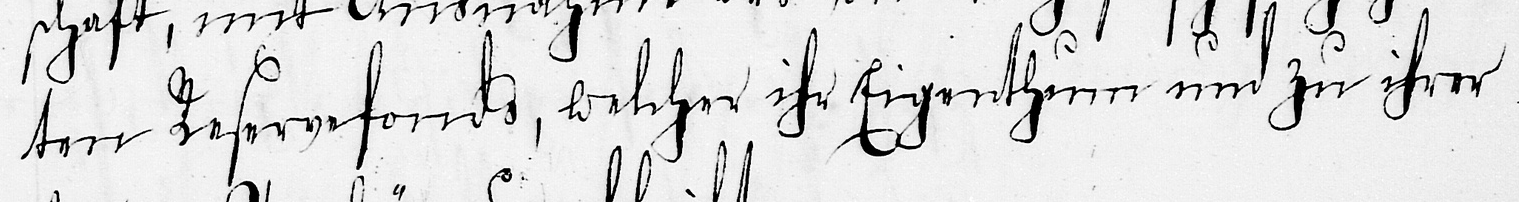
ten Reservefonds, welcher ihr Eigenthum und zu ihrer
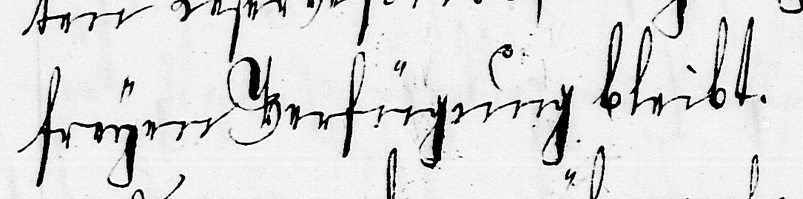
freyen Verfügung bleibt.
